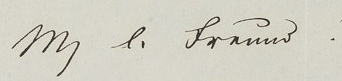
M l. Freund!
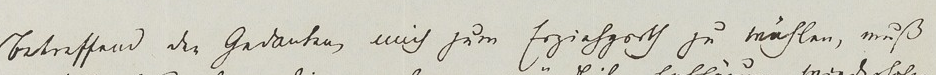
Betreffend den Gedanken, mich zum Erziehgsrth zu wählen, muß
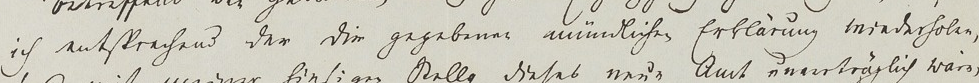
ich entsprechend der dir gegebenen mündlichen Erklärung wiederholen,
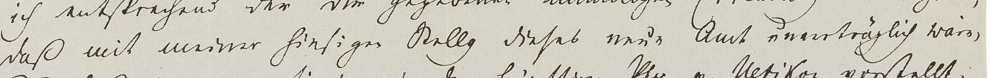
daß mit meiner hiesigen Stellung dieses neue Amt unverträglich wäre,
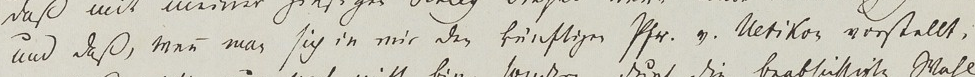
und daß, wenn man sich in mir den künftigen Pfr. v. Uetikon vorstellt,
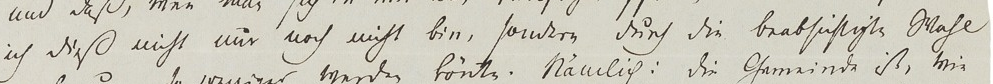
ich dieß nicht nur noch nicht bin, sondern durch die beabsichtigte Wahl
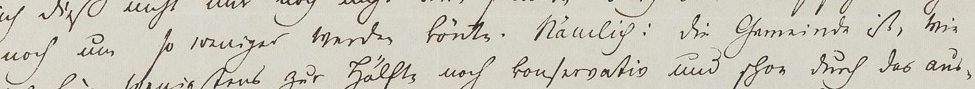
noch um so weniger werden könnte. Nämlich: die Gemeinde ist, wie
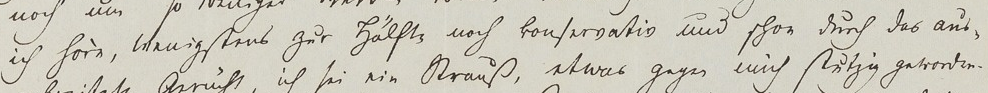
ich höre, wenigstens zur Hälfte noch konservativ und schon durch das aus-
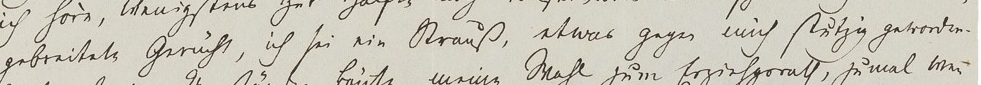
gebreitete Gerücht, ich sei ein Strauß, etwas gegen mich stutzig geworden.
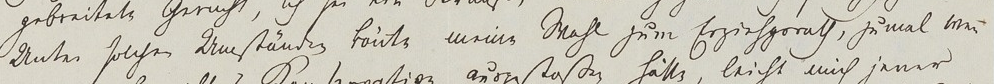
Unter solchen Umständen könnte meine Wahl zum Erziehgsrath, zumal wenn
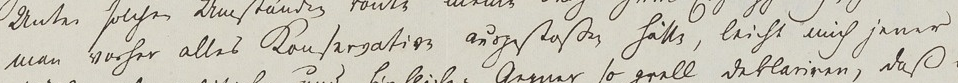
man vorher alles Konservative ausgestoßen hätte, leicht mich jener
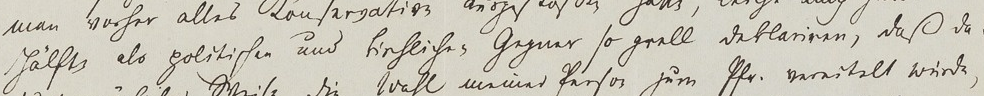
Hälfte als politischen und kirchlichen Gegner so grell deklariren, daß da-
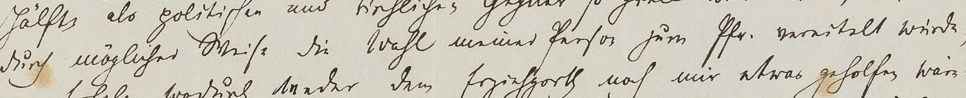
durch möglicher Weise die Wahl meiner Person zum Pfr. vereitelt würde,
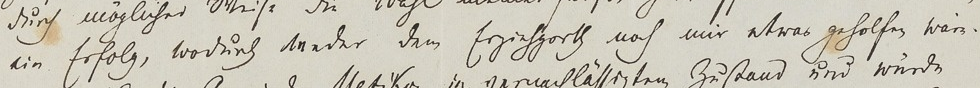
ein Erfolg, wodurch weder dem Erziehgsrth noch mir etwas geholfen wäre.
